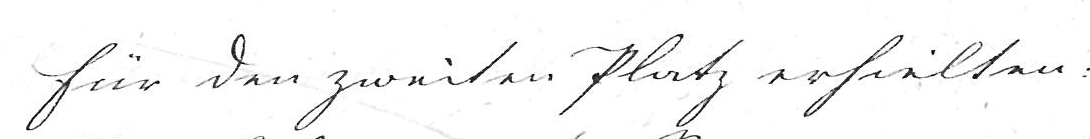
Für den zweiten Platz erhielten:
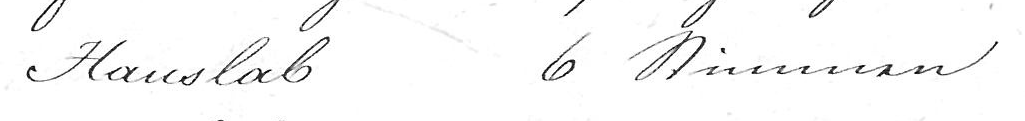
Hauslab 6 Stimmen
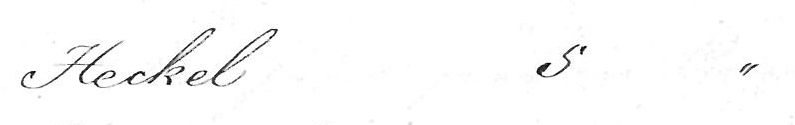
Heckel 5 "
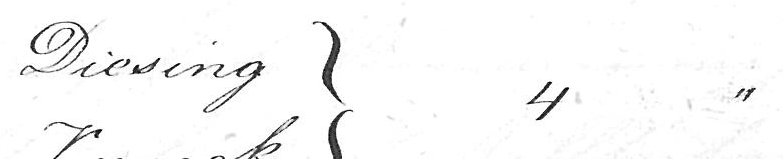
Diesing 4 "
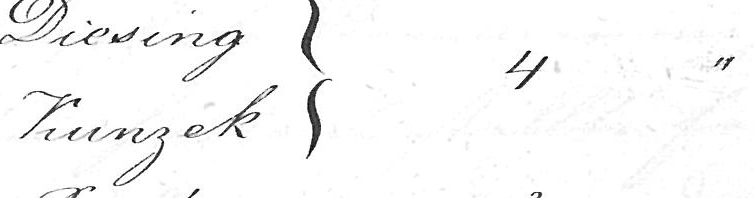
Kunzek 4 "
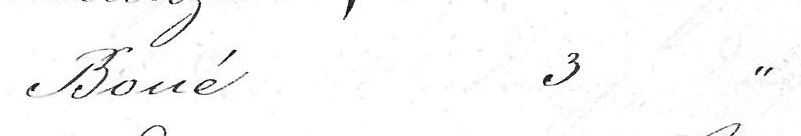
Boué 3 "
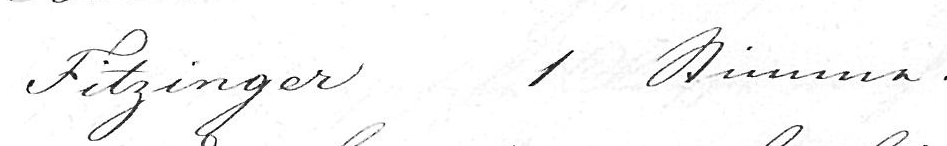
Fitzinger 1 Stimme
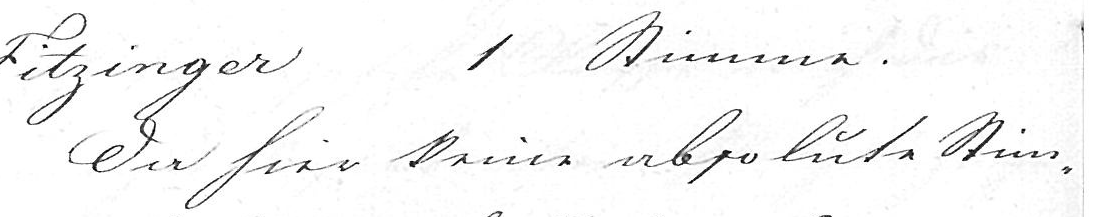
Da hier keine absolute Stim-
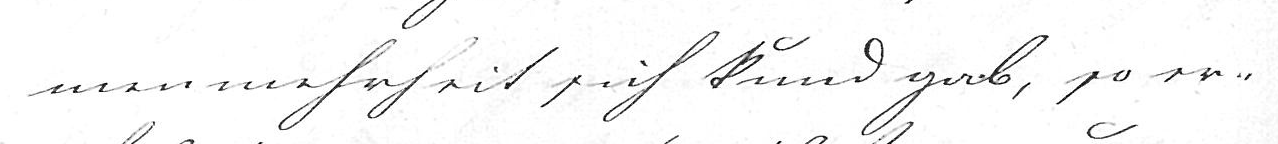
menmehrheit sich kund gab, so er-
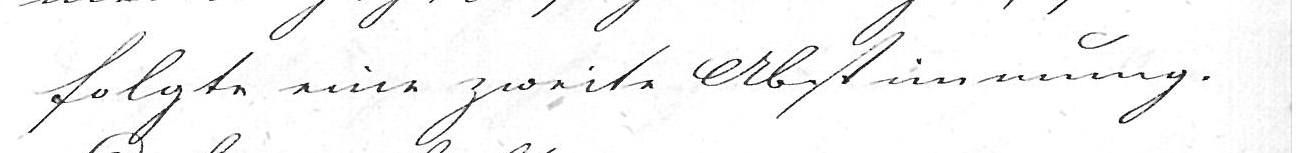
folgte eine zweite Abstimmung.
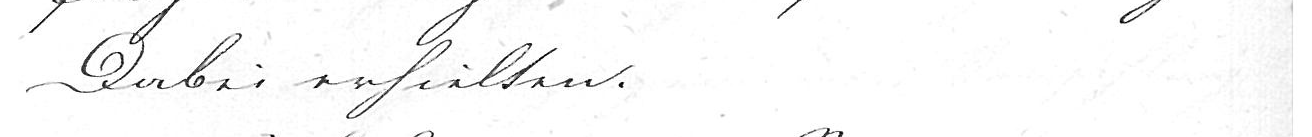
Dabei erhielten.
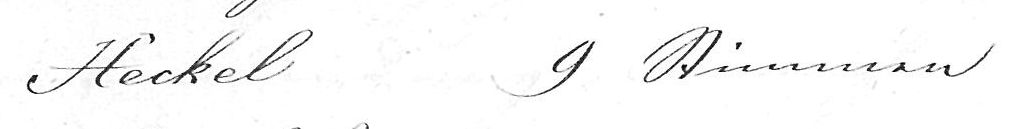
Heckel. 9 Stimmen
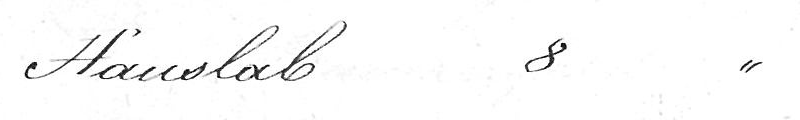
Hauslab 8 "
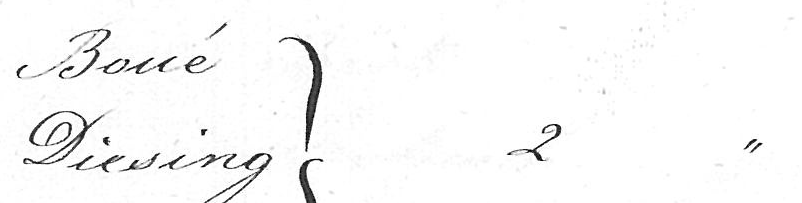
Boué 2"
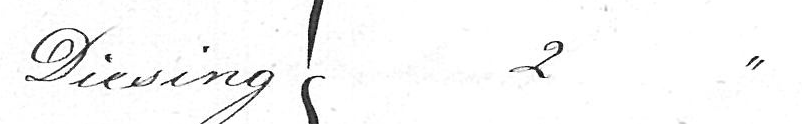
Diesing 2 "
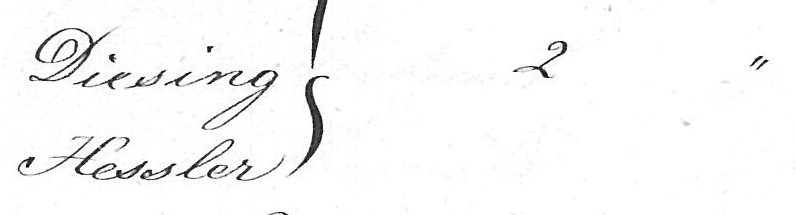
Hessler 2 "
